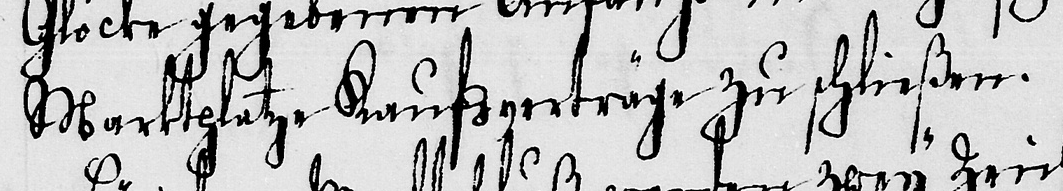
Marktplatze Kaufsverträge zu schließen.
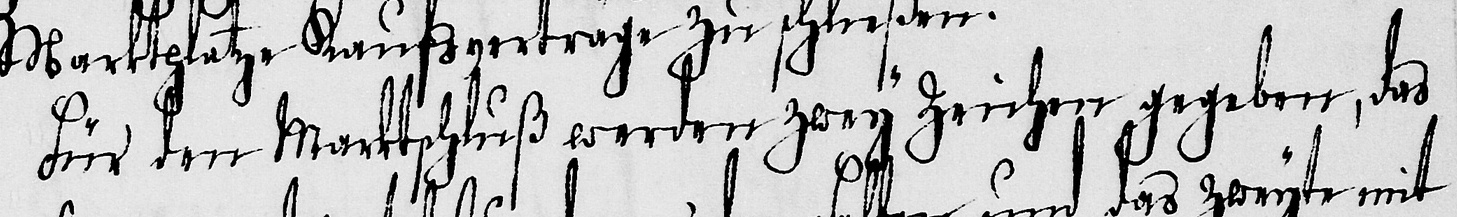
Für den Marktschluß werden zwey Zeichen gegeben, das
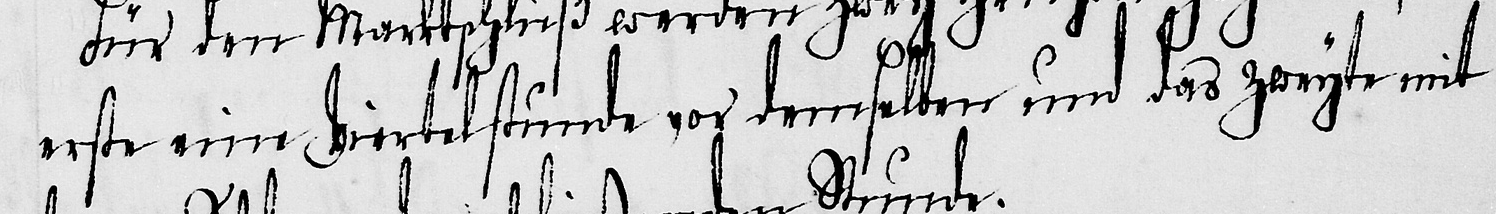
erste eine Viertelstunde vor demselben und das zweyte mit
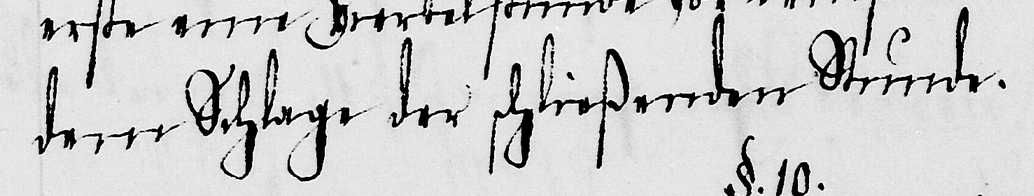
dem Schlage der schließenden Stunde.
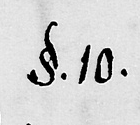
§.10.
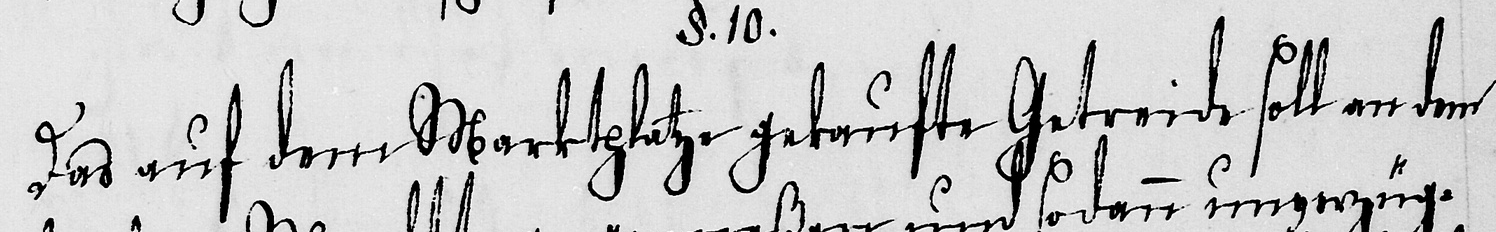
Das auf dem Marktplatze gekaufte Getreide soll an
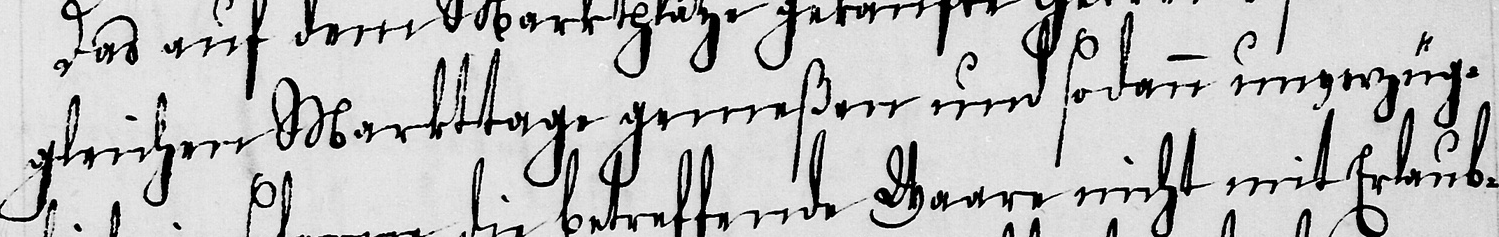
gleichen Markttage gemeßen und sodann unverzüg¬
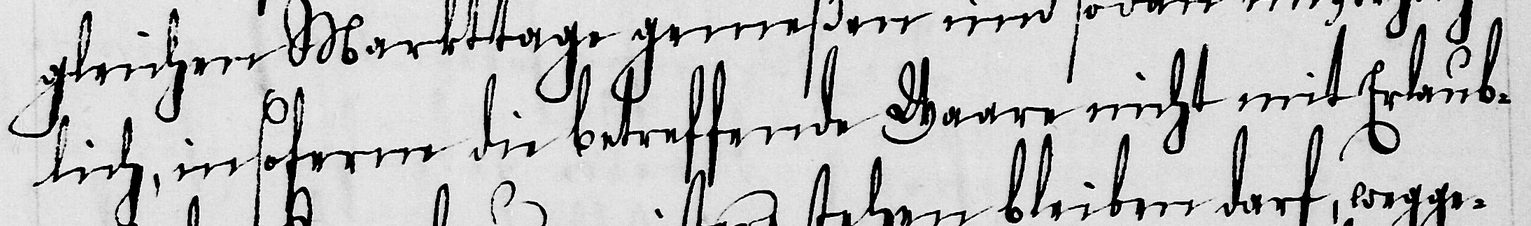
lich, insoferne die betreffende Waare nicht mit Erlaub¬
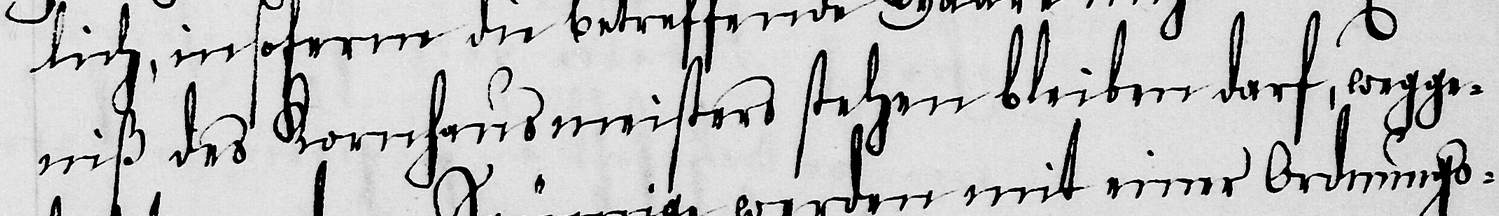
niß des Kornhausmeisters stehen bleiben darf, wegge¬
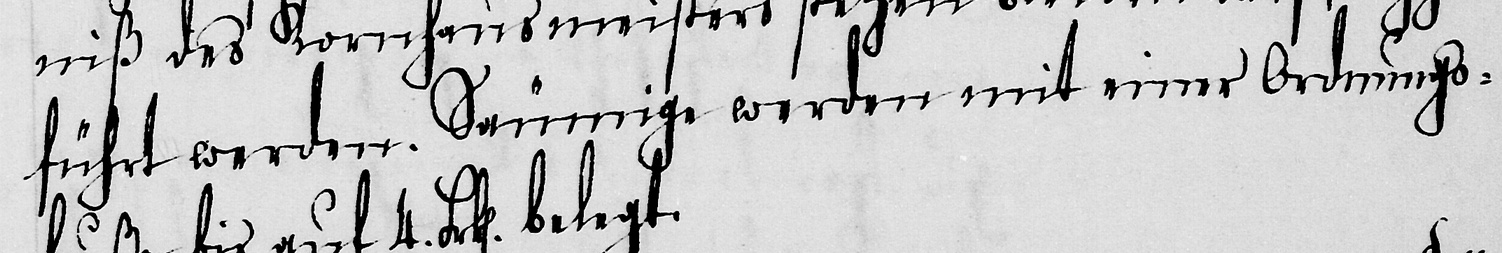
führt werden. Säumige werden mit einer Ordnungs¬
